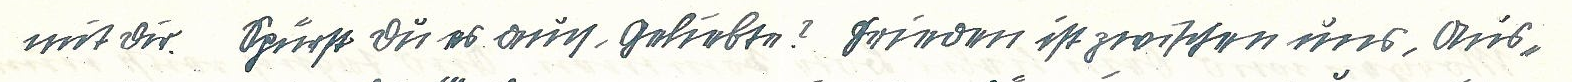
mit Dir. Spürst Du es auch, Geliebte? Frieden ist zwischen uns, Aus¬
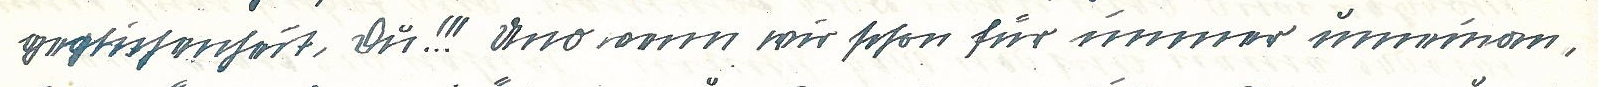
geglichenheit, Du!!! Und wenn wir schon für immer umeinan¬
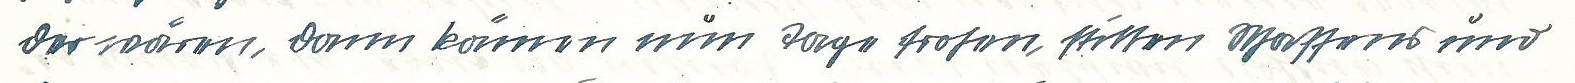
der wären, dann kämen nun Tage frohen, stillen Schaffens und
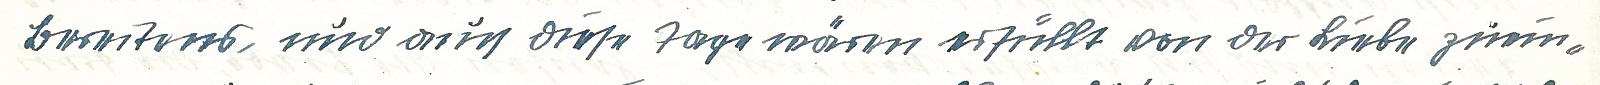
Bereitens, und auch diese Tage wären erfüllt von der Liebe zuein¬
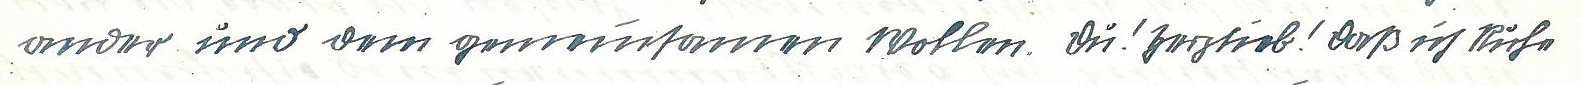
ander und dem gemeinsamen Wollen. Du! Herzlieb! Daß ich Ruhe
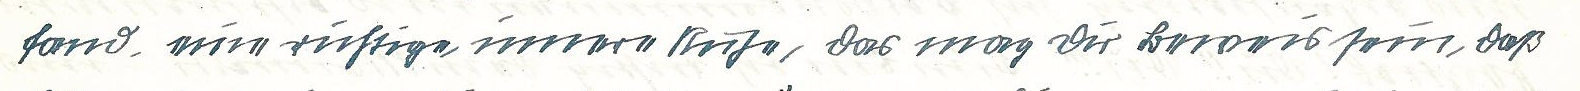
fand, eine richtige, innere Ruhe, das mag Dir Beweis sein, daß
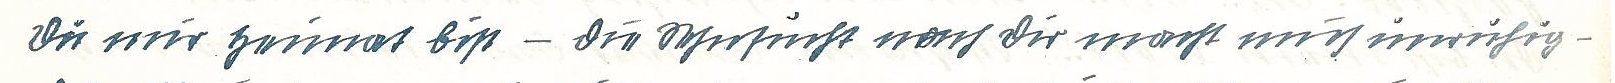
Du mir Heimat bist – die Sehnsucht nach Dir macht mich unruhig –
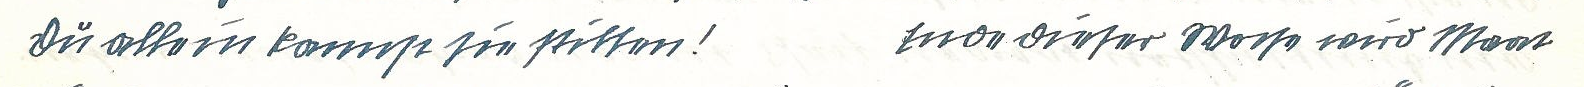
Du allein kannst sie stillen! Ende dieser Woche wird Maat
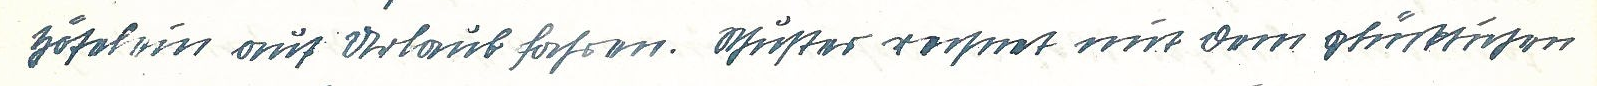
H. auf Urlaub fahren. Sch. rechnet mit dem glücklichen
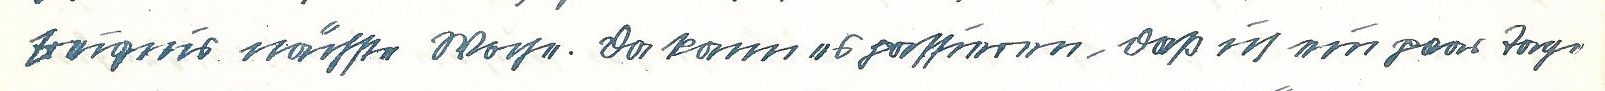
Ereignis nächste Woche. Da kann es passieren, daß ich ein paar Tage
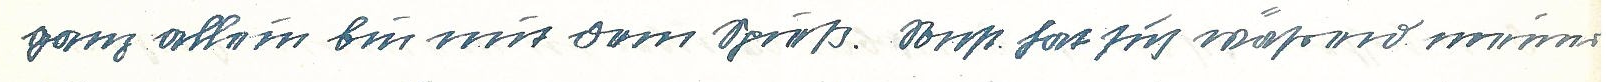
ganz allein bin mit dem Spieß. Sonst hat sich während meiner
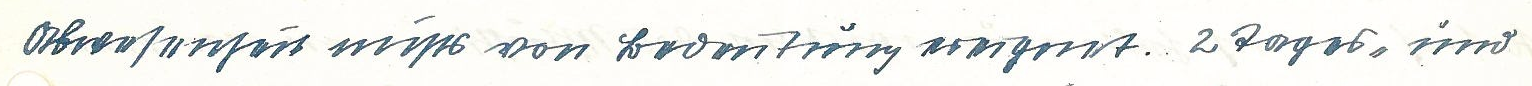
Abwesenheit nichts von Bedeutung ereignet. 2 Tages– und
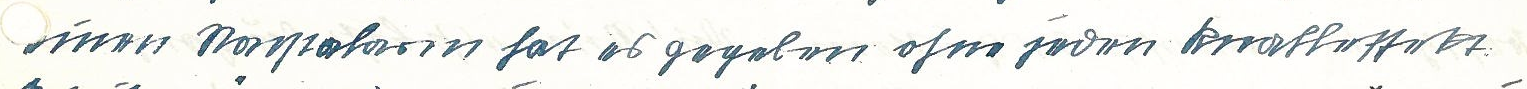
einen Nacht alarm hat es gegeben ohne jeden Knalleffekt.
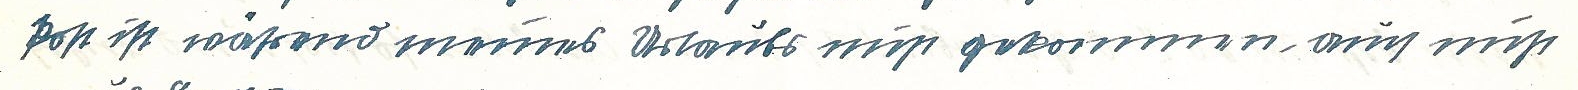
Post ist während meines Urlaubs nicht gekommen, auch nicht
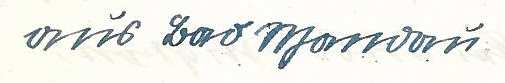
aus Bad Sch.
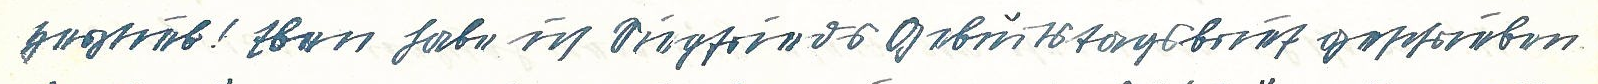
Herzlieb! Eben habe ich S.s Geburtstagsbrief geschrieben.
